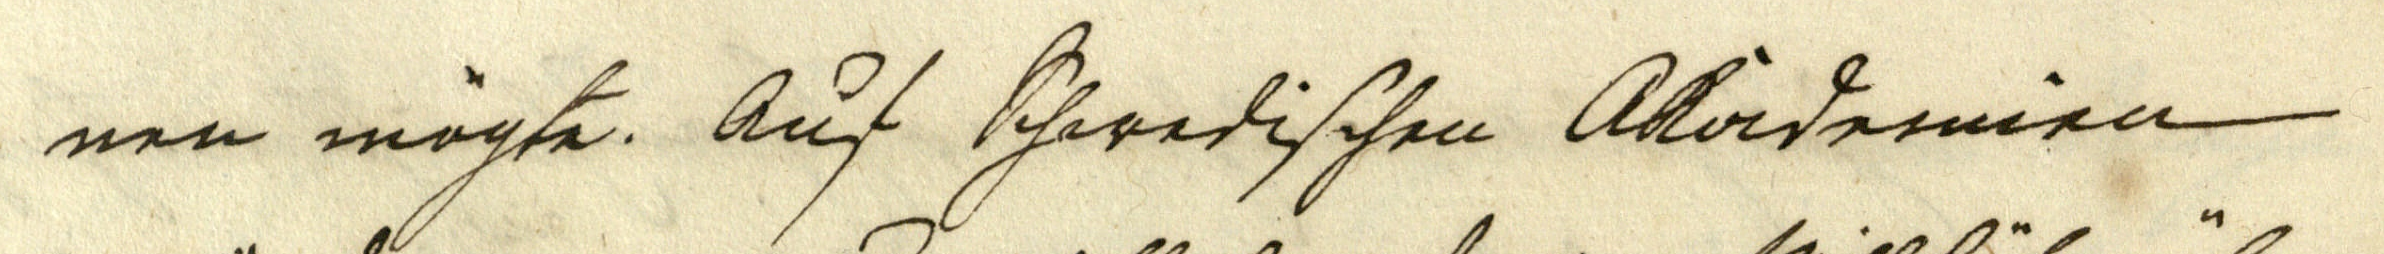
nen mögte. Auf Schwedischen Akademien
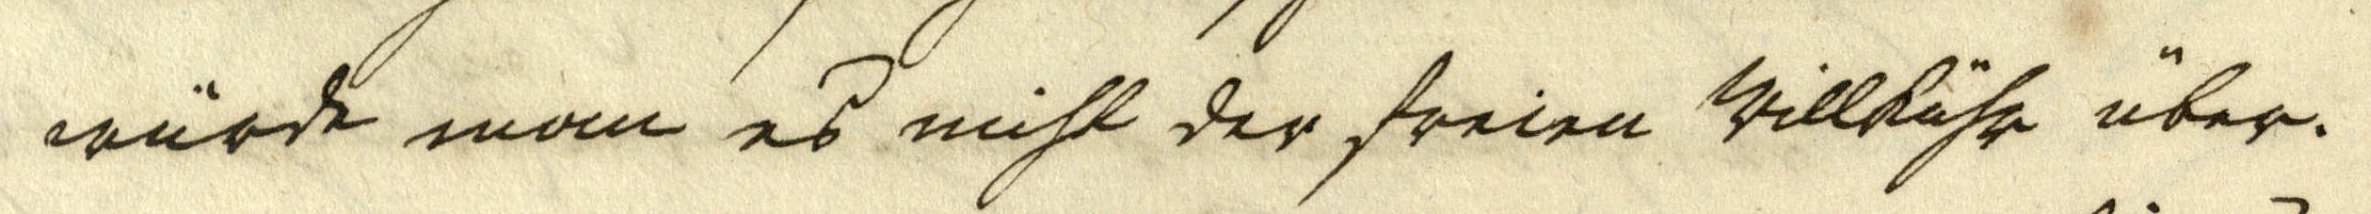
würde man es nicht der freien Willkühr über-
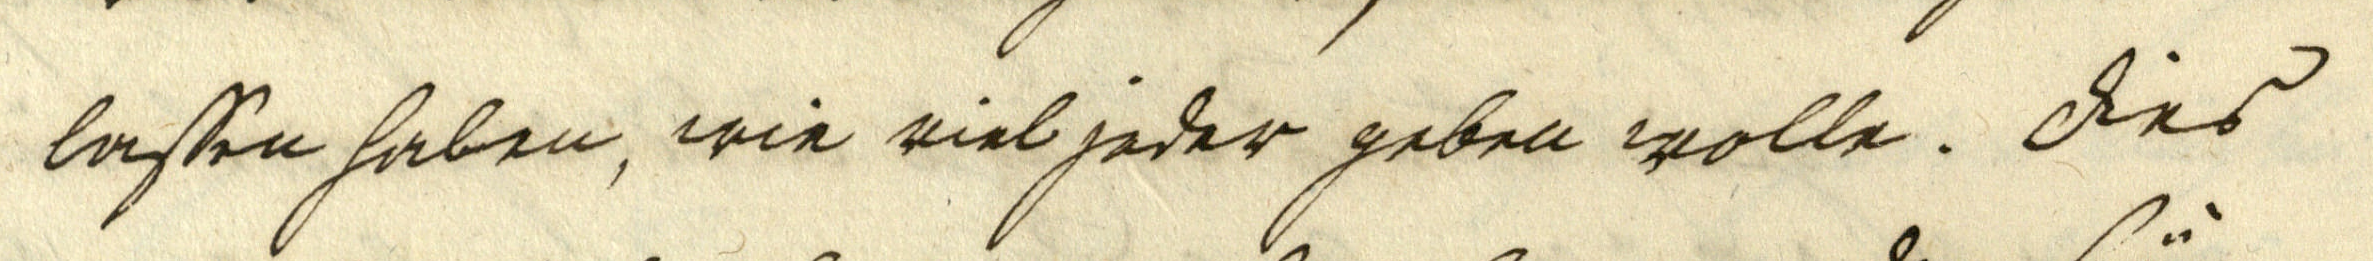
lassen haben, wie viel jeder geben wolle. Dies
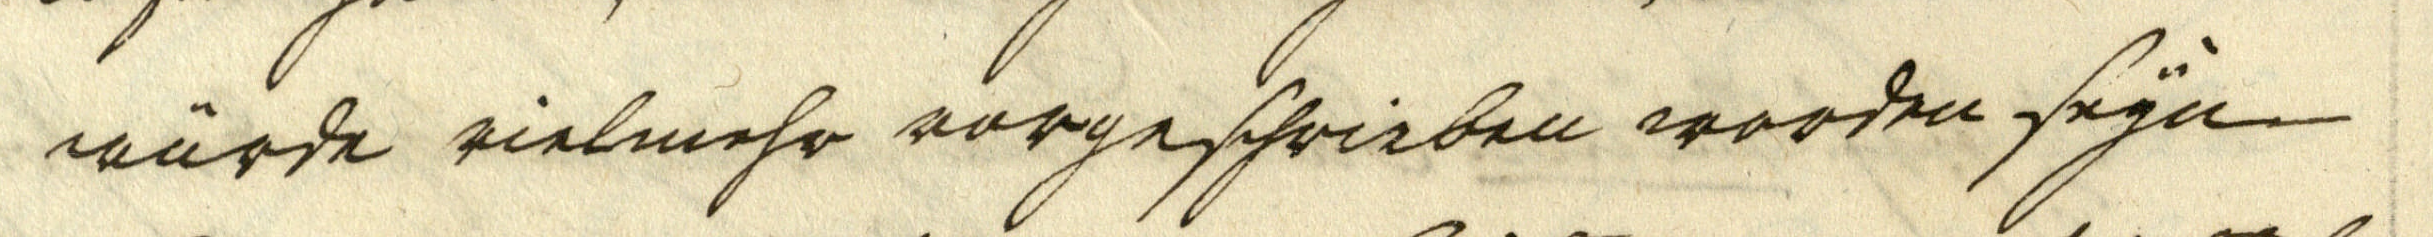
würde vielmehr vorgeschrieben worden seyn.
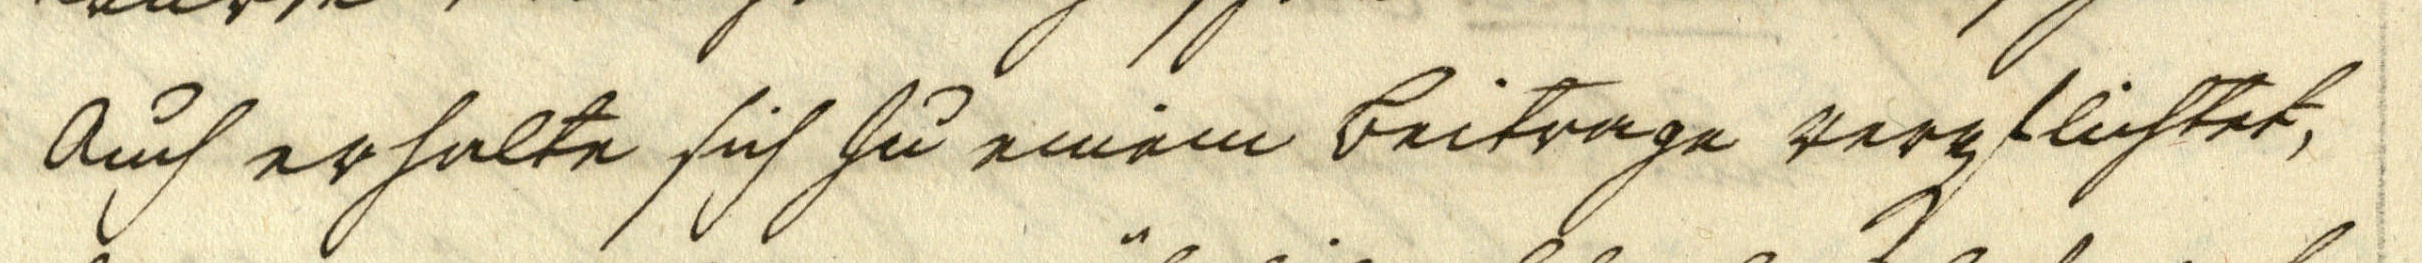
Auch er halte sich zu einem Beitrage verpflichtet,
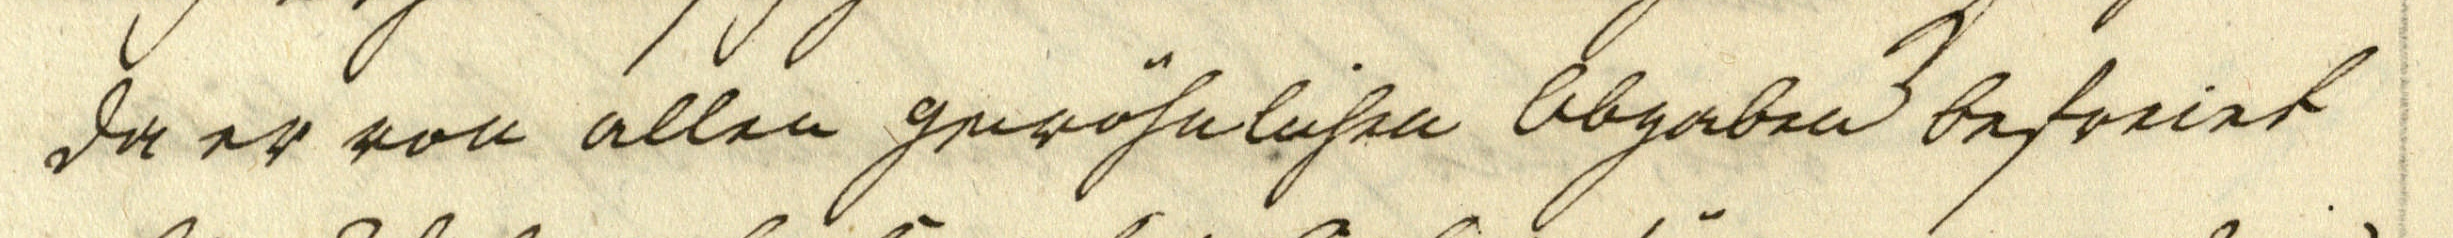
da er von allen gewöhnlichen Abgaben befreiet
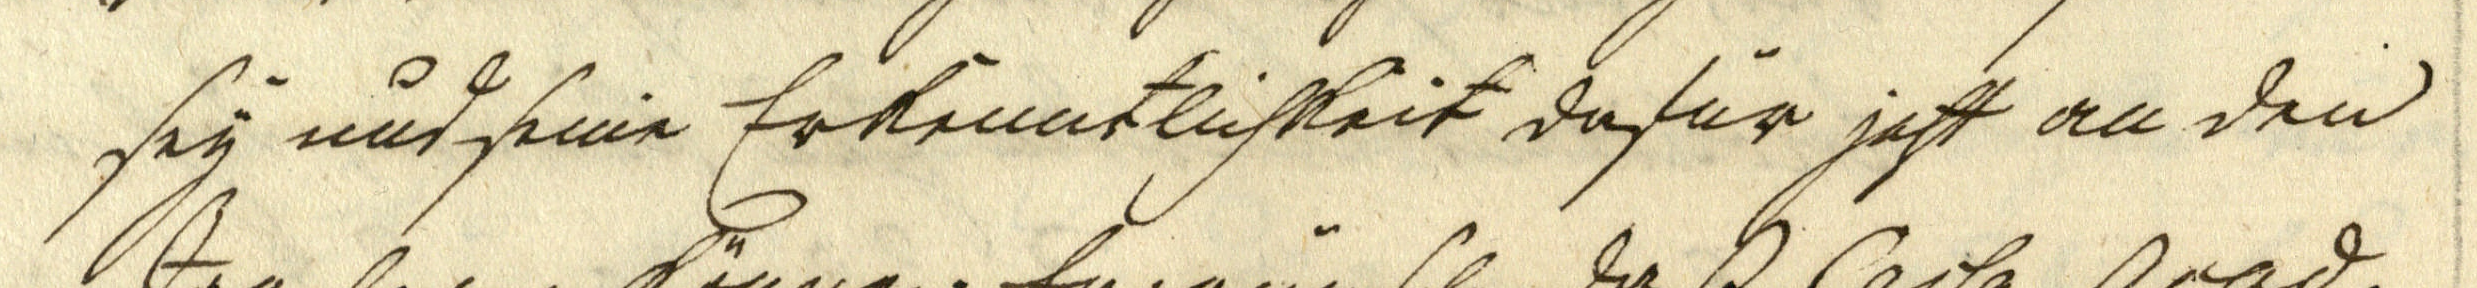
sey und seine Erkenntlichkeit dafür jetzt an den
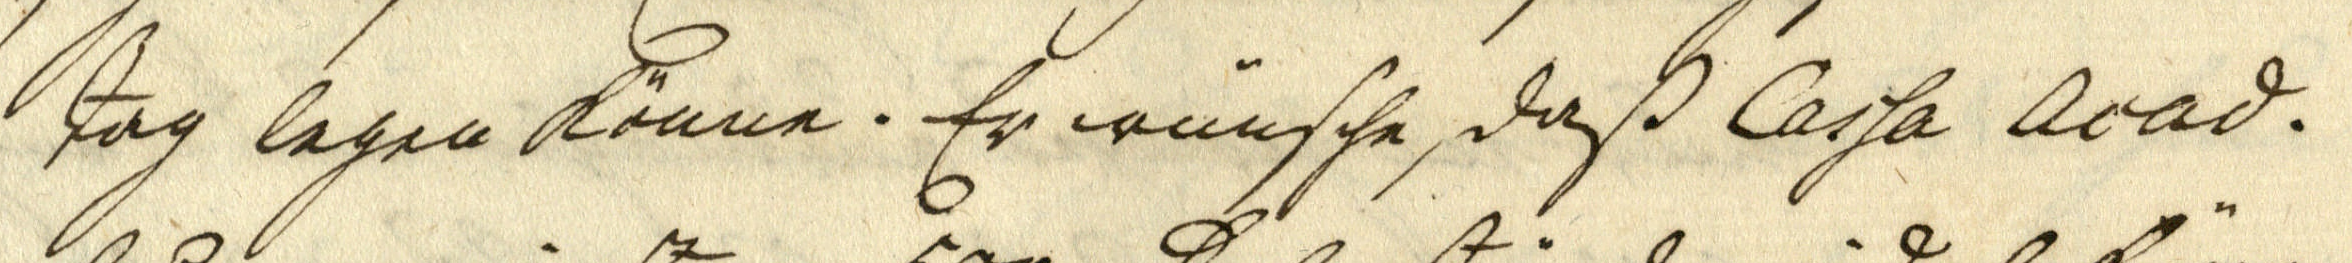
Tag legen könne. Er wünsche, daß Cassa Acad.
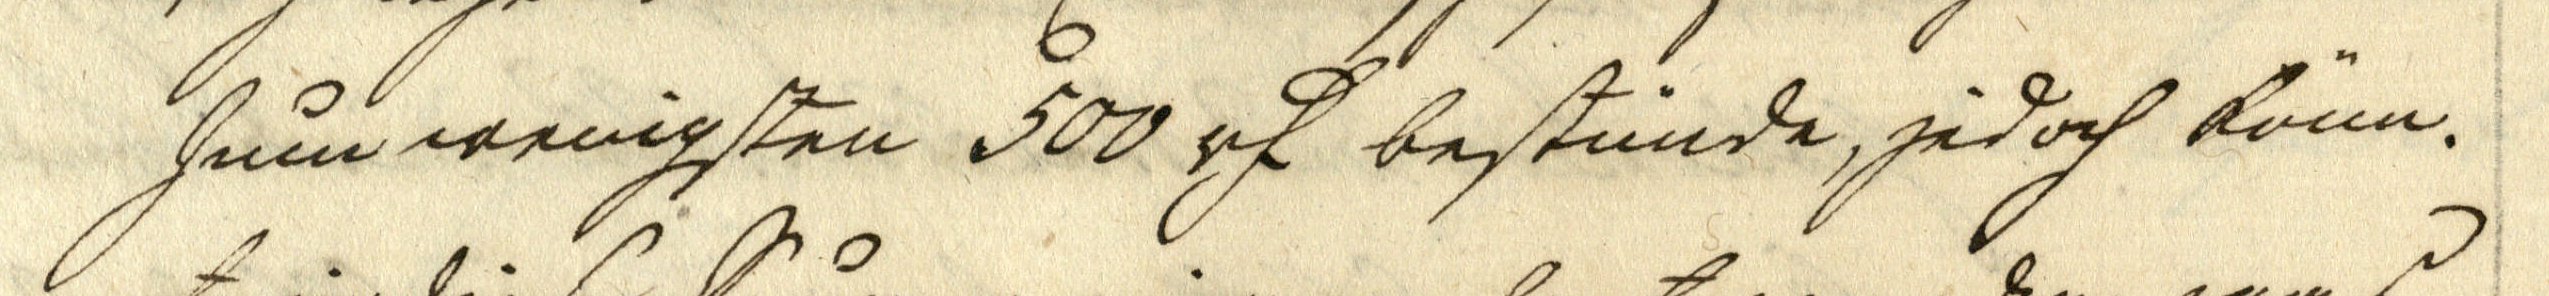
zum wenigsten 500 rth. bestünde, jedoch könn-
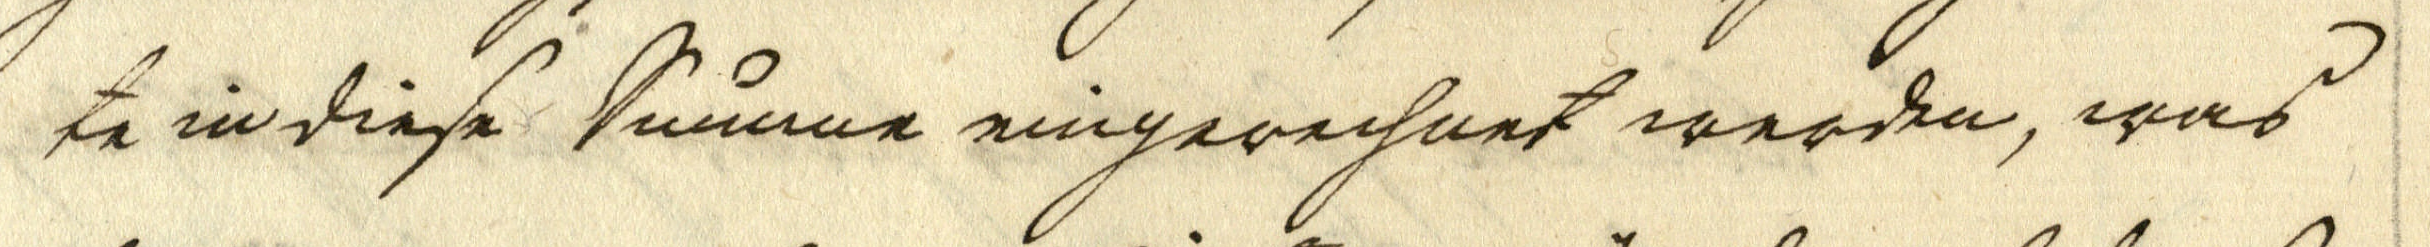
te in diese Summe eingerechnet werden, was
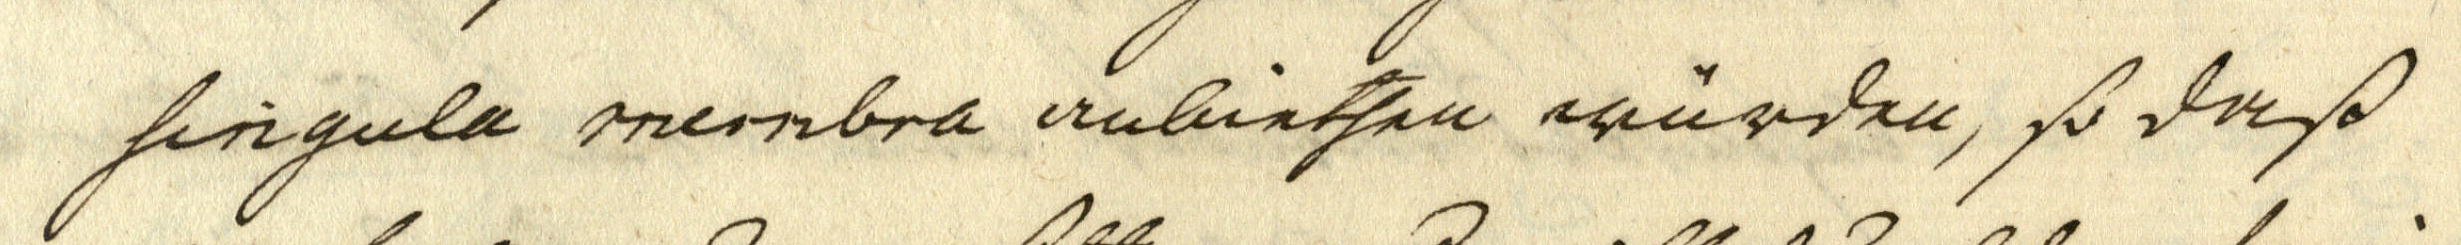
singula membra anbiethen würden, so daß
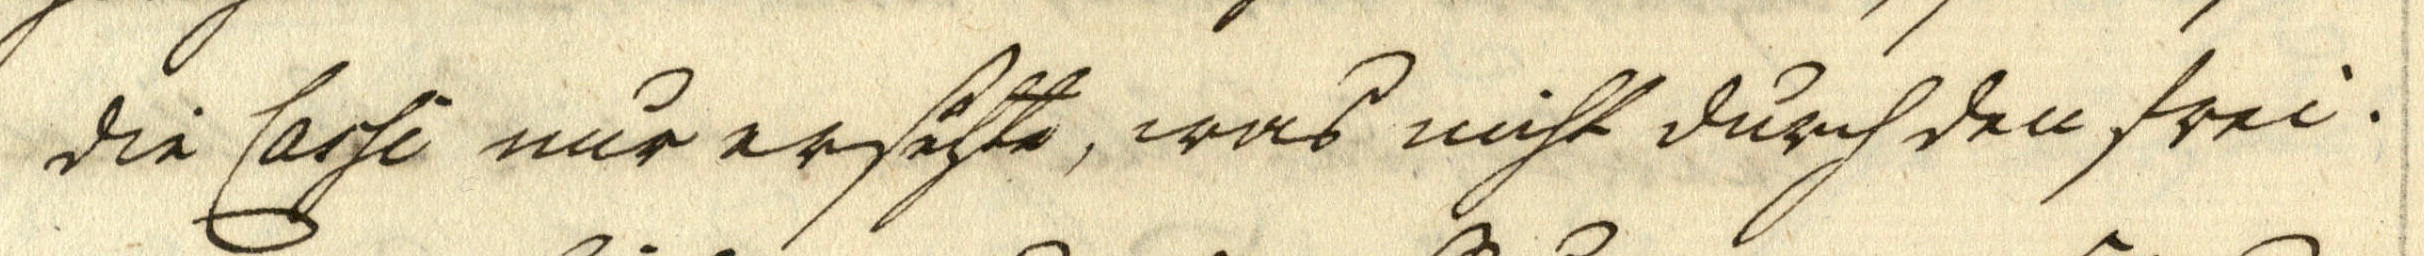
die Casse nur ersetzte, was nicht durch den frei-
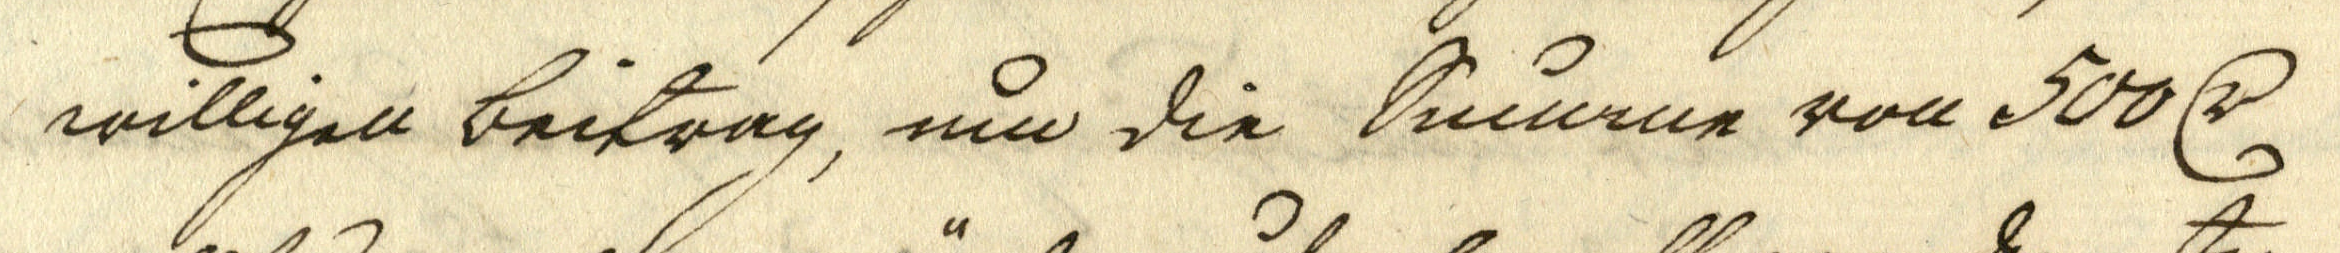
willigen Beitrag, um die Summe von 500 rtl.
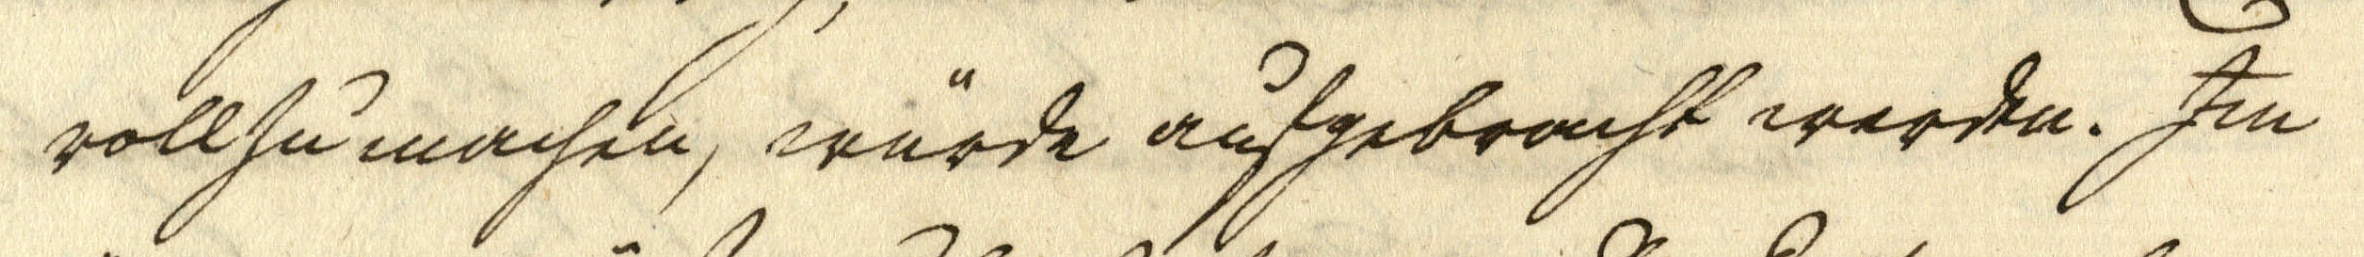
vollzumachen, würde aufgebracht werden. Im
